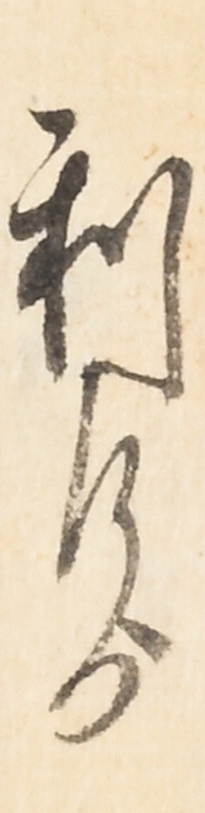利左衛門
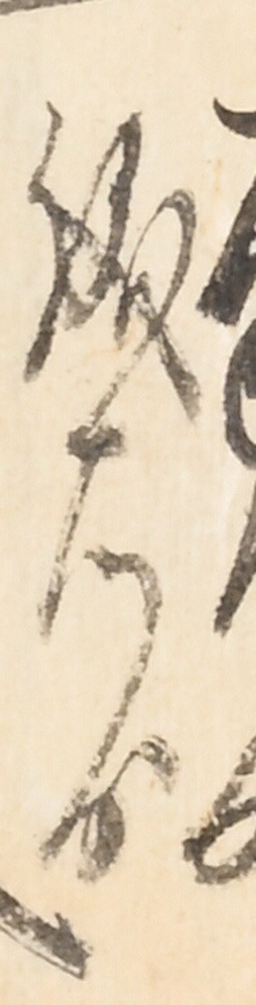儀右衛門
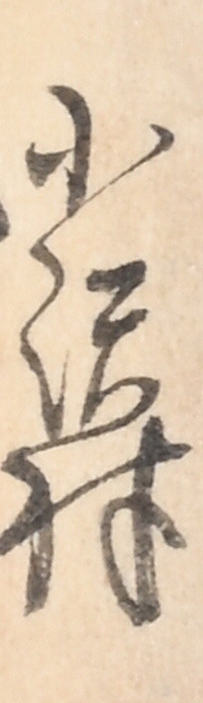芦沢村
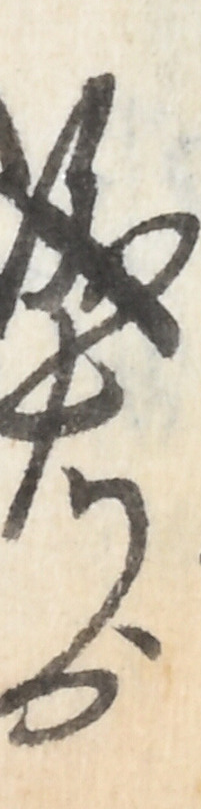十右衛門

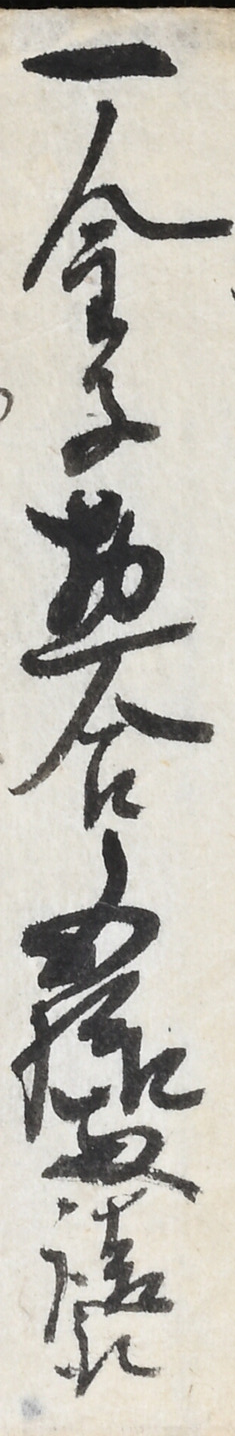一金子惣合五拾両請取
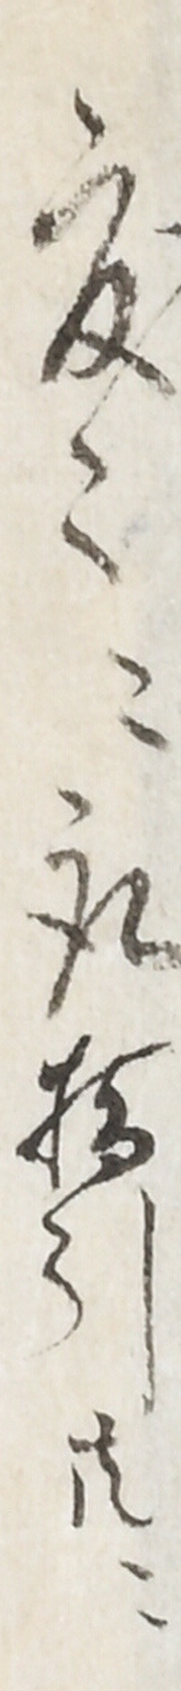度々ニ取指引共ニ
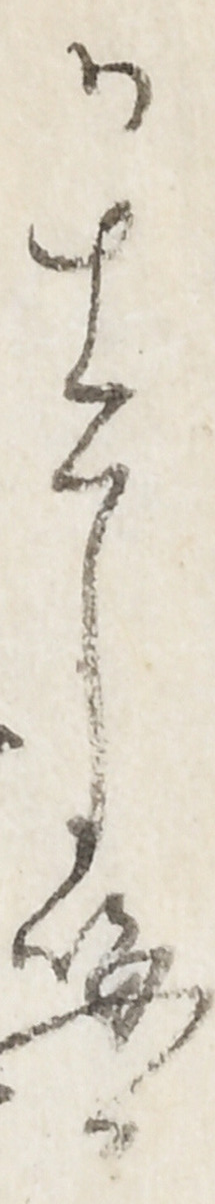同十二月晦日
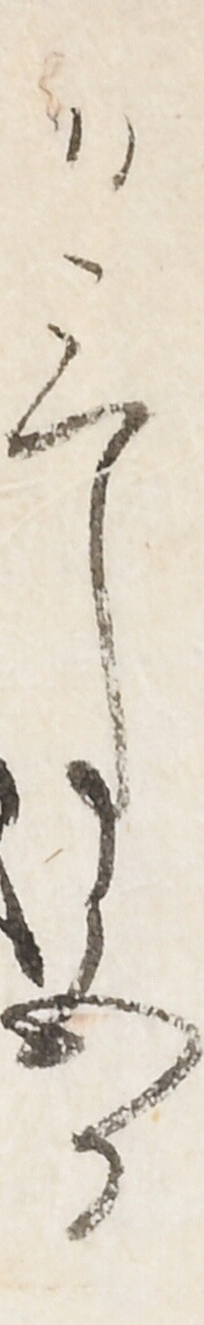同三月五日
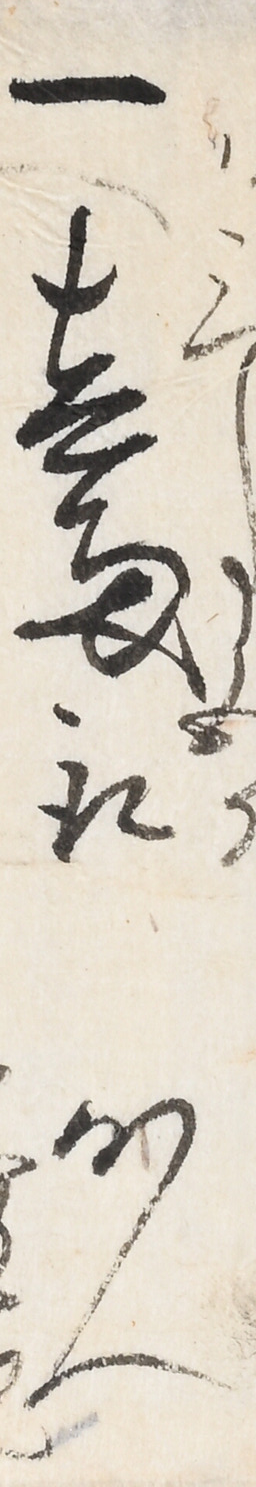一壱両取同人
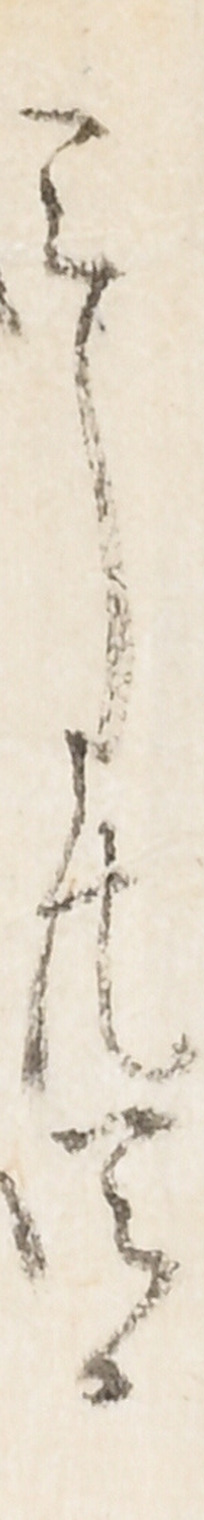四月廿四日
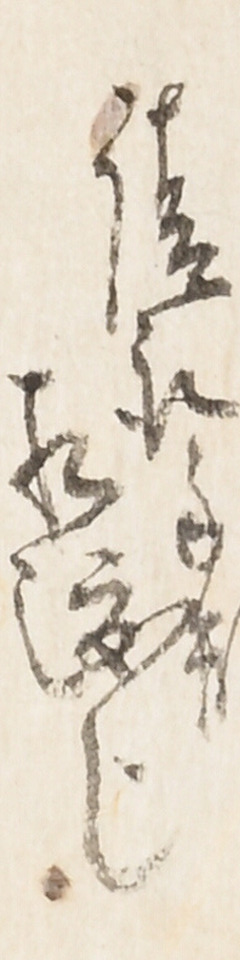相渡し
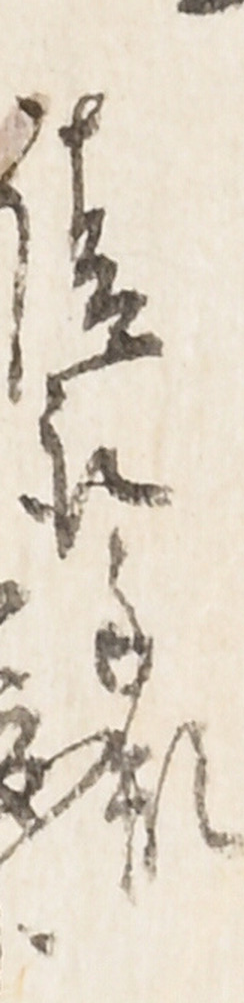請取手形
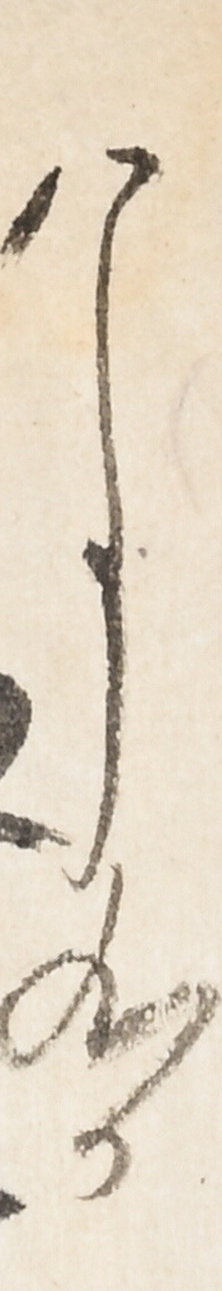八月九日
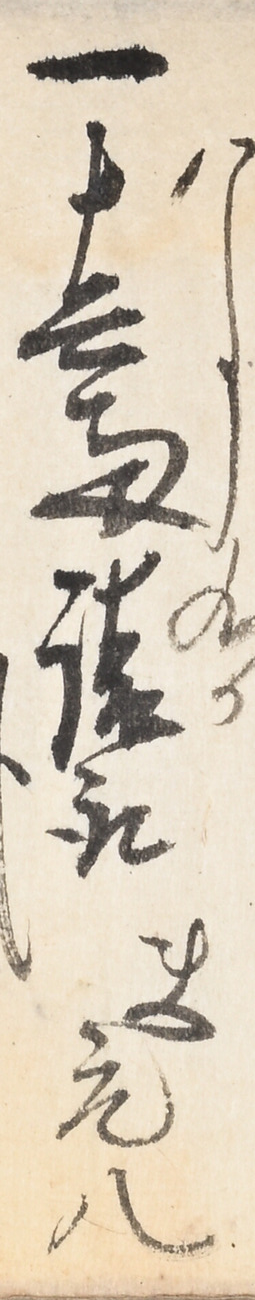一壱両請取使元八
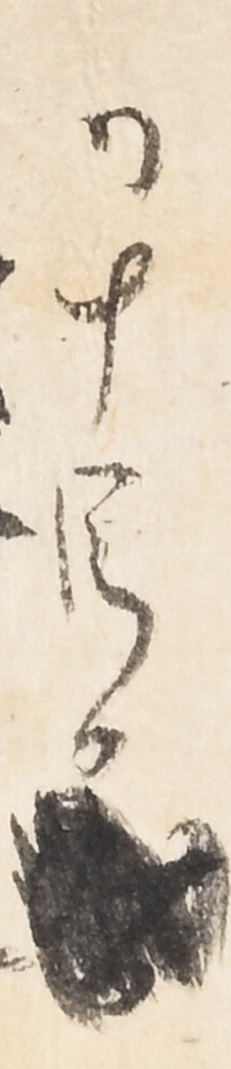同十四日
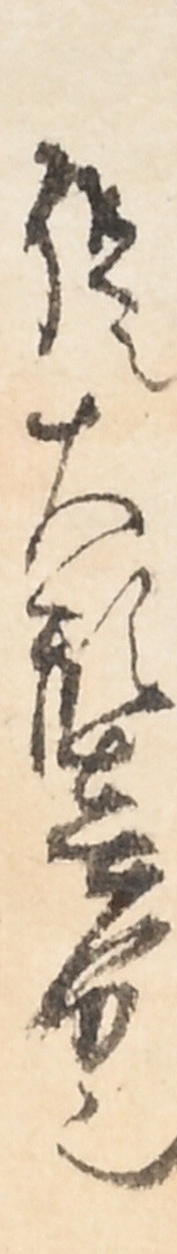但し大形壱分也
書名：合力覚帳
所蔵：伊那市立高遠町図書館・合同会社AMANE
